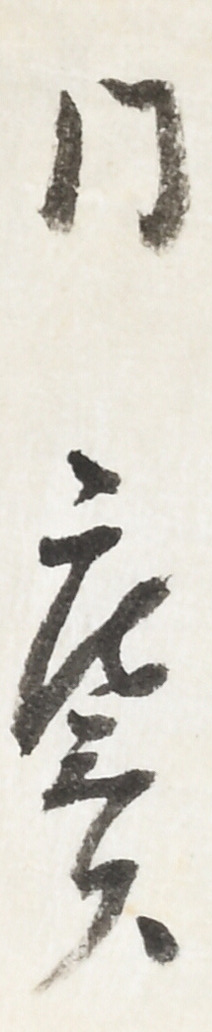同庄三郎
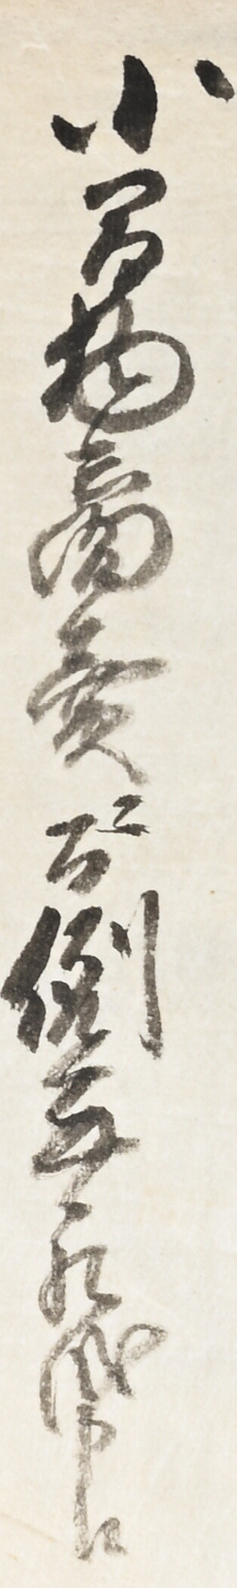小間物商売ニ而例年罷越申候
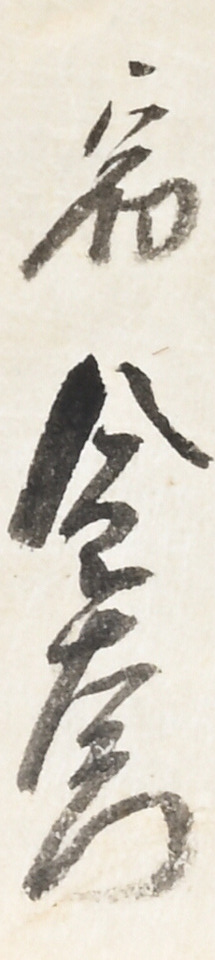宿金右衛門
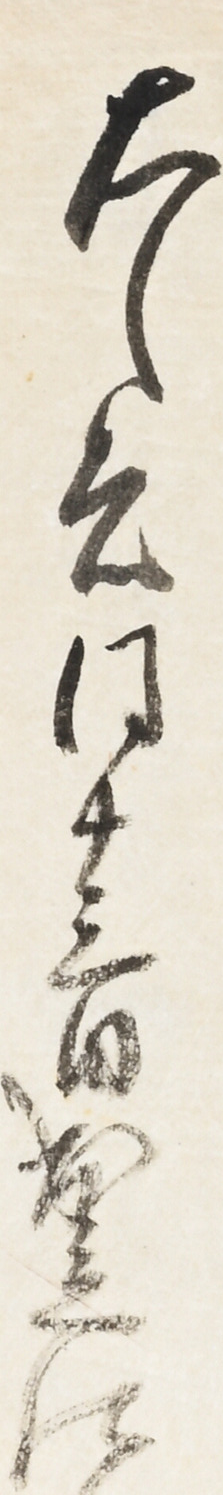右之者同十一日出立仕候
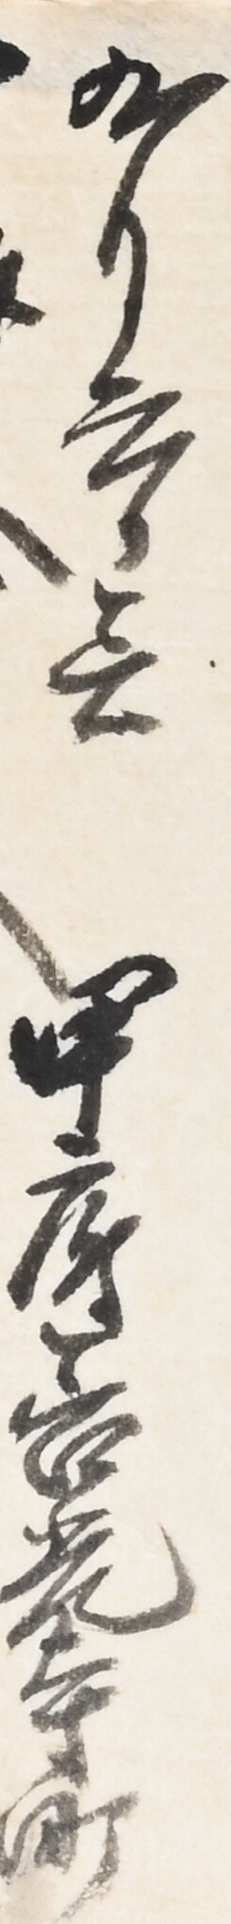九月六日着甲府善光寺町
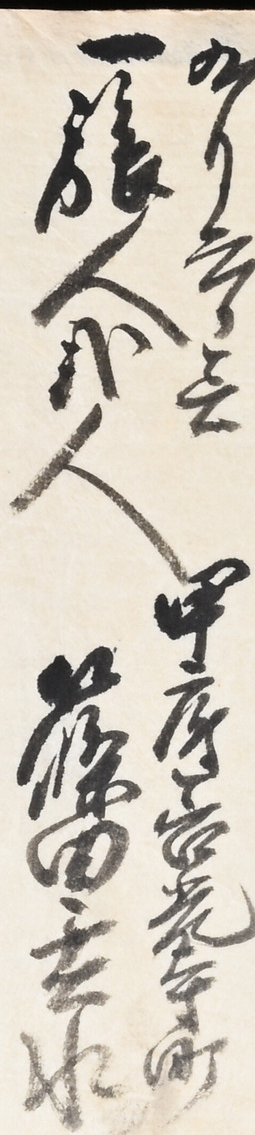一旅人弐人篠田玄水
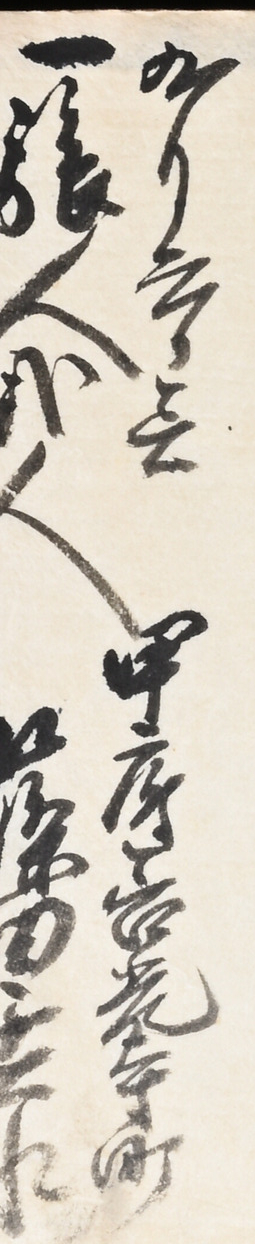九月六日着甲府善光寺町
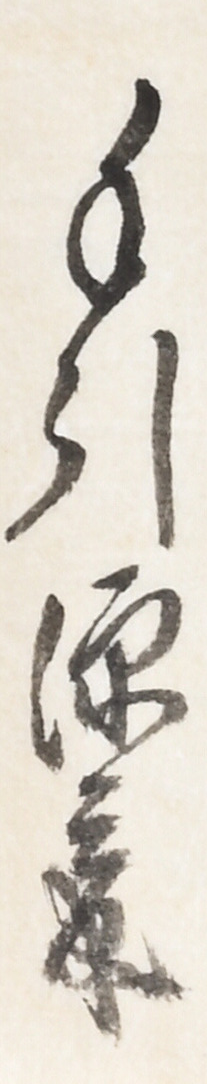手引源兵衛
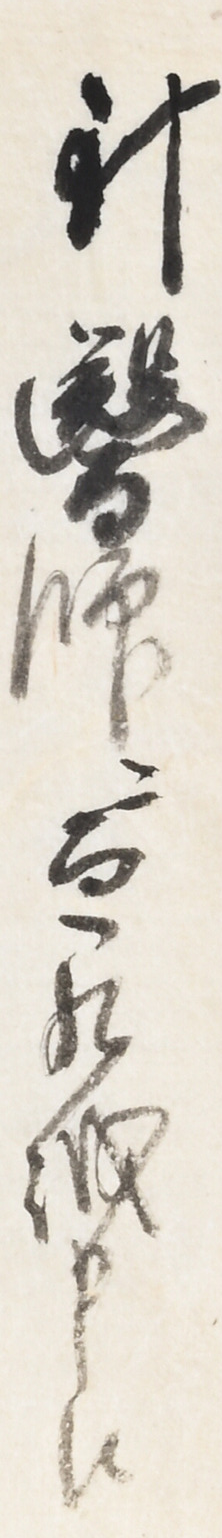針医師ニ而罷越申候
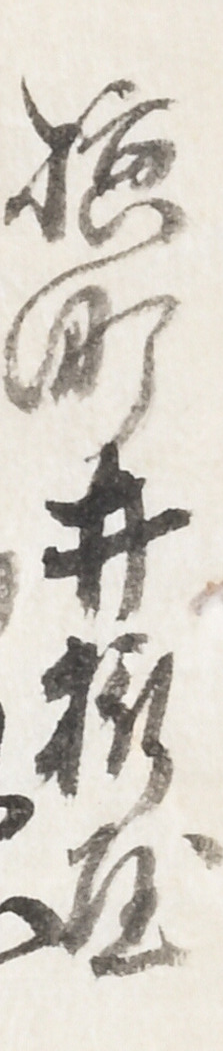横町井桁屋
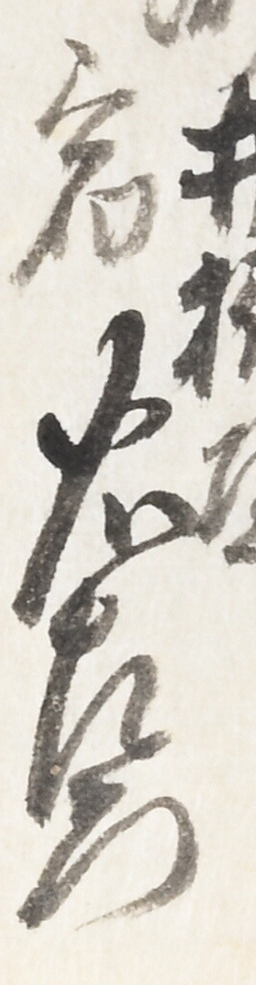宿忠左衛門
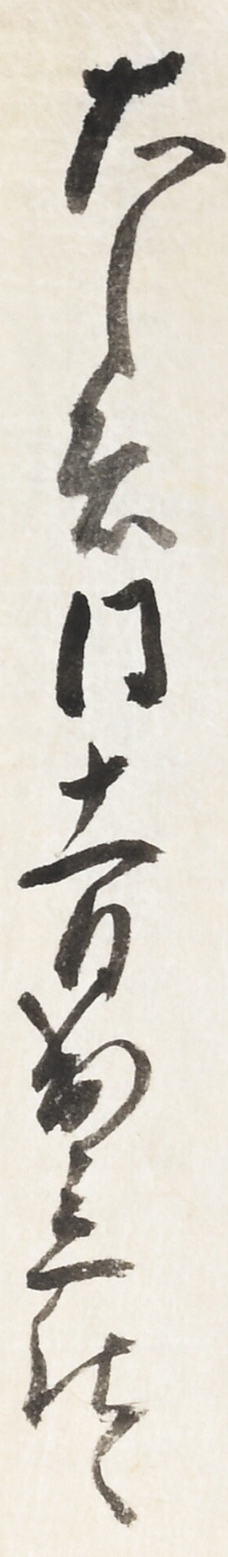右之者同十一日出立仕候
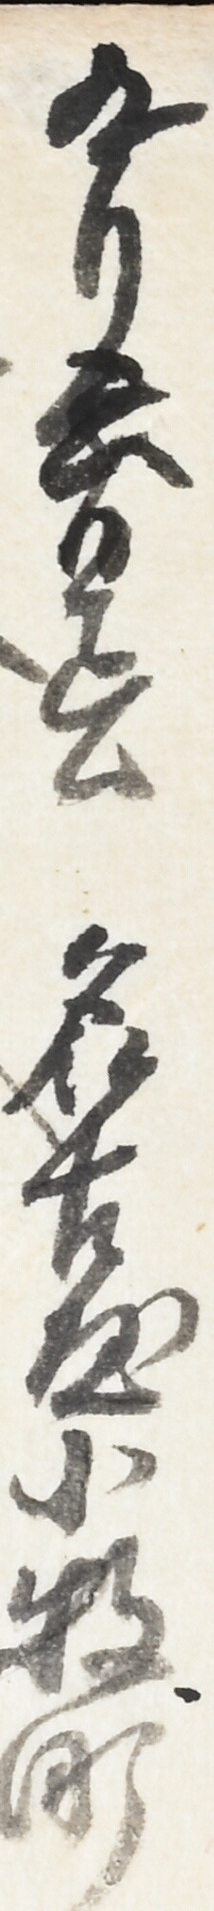九月六日着名古屋小牧町
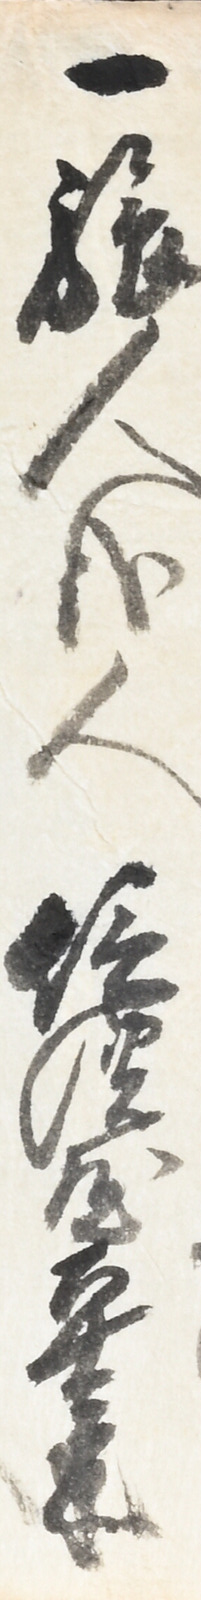一旅人弐人信濃屋平兵衛
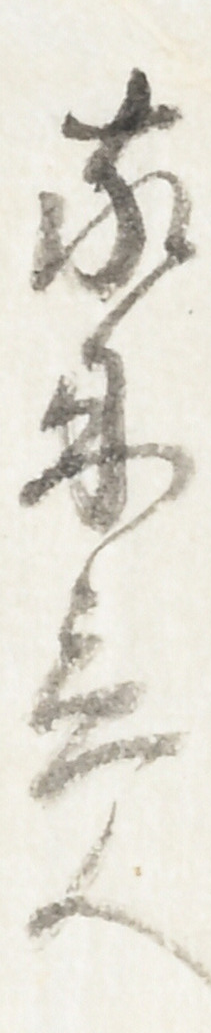家来壱人
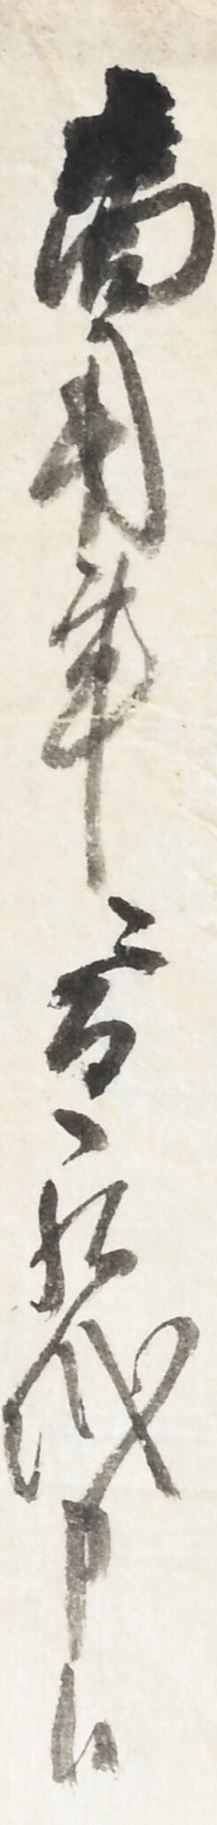番用事ニ而罷越申候
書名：旅人泊控帳
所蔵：伊那市立高遠町図書館・合同会社AMANE
